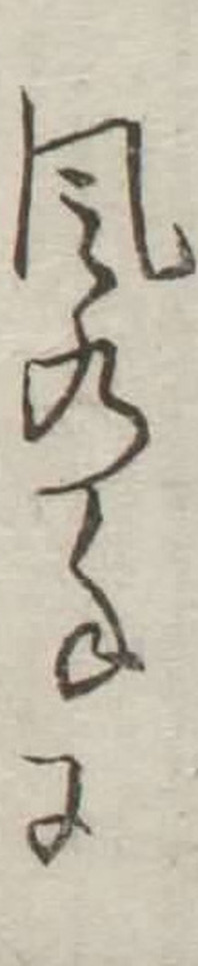風の手に
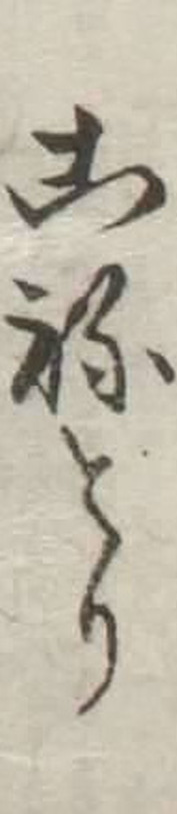こねとり
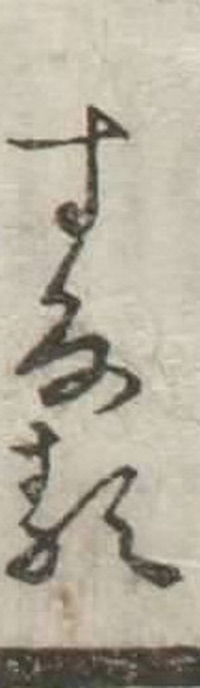すなる
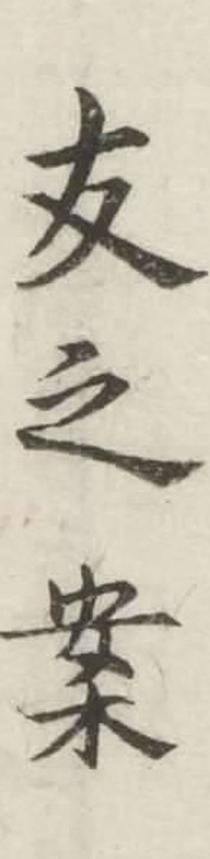友之案
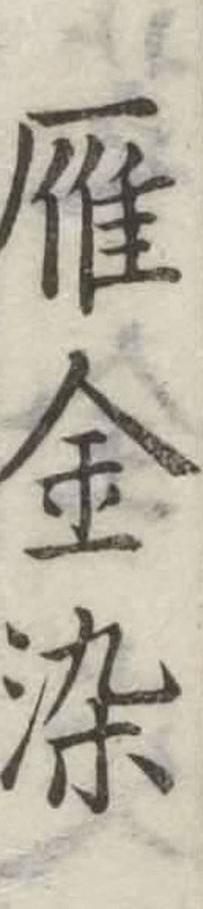雁金染
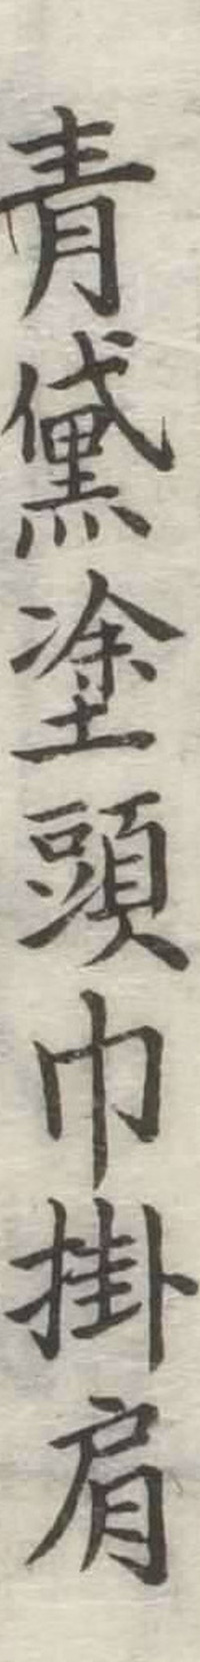青黛塗頭巾掛肩
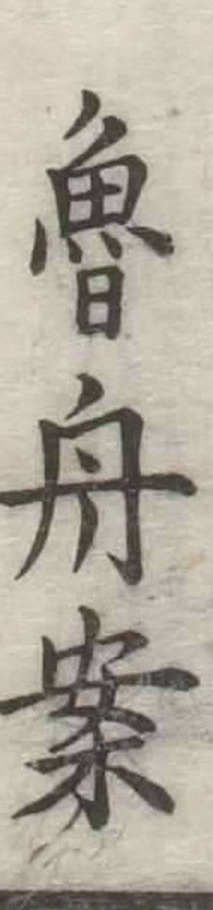魯舟案
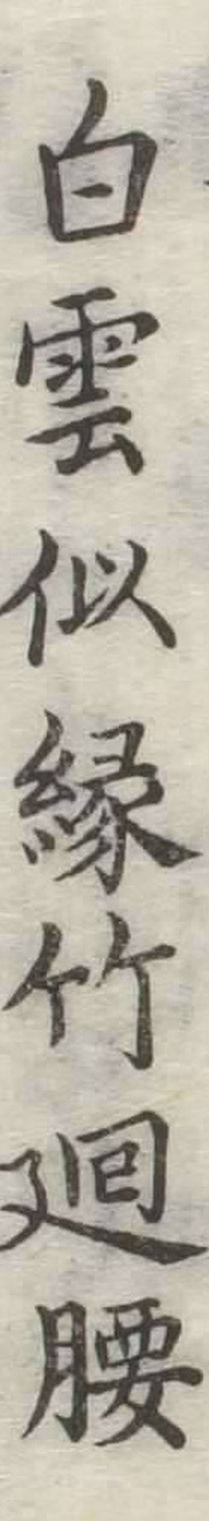白雲似縁竹廻腰
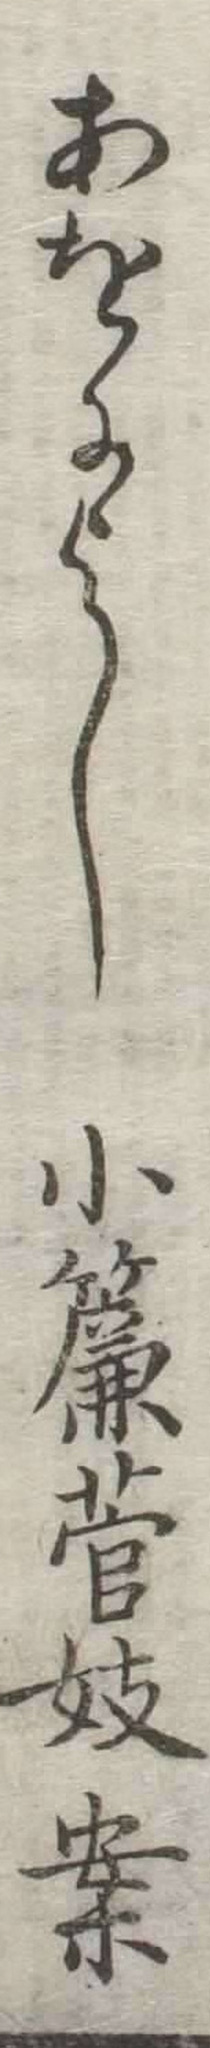あをによし小簾菅妓案
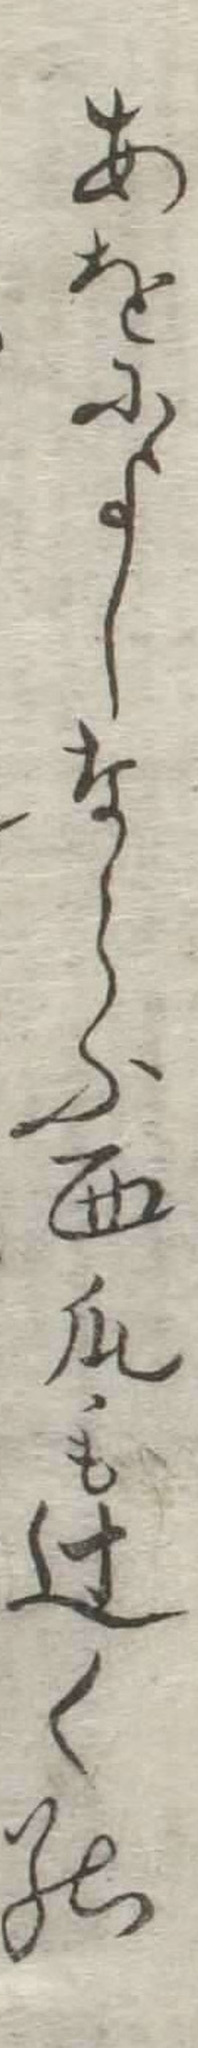あをによしならふ西瓜も辻〳〵の
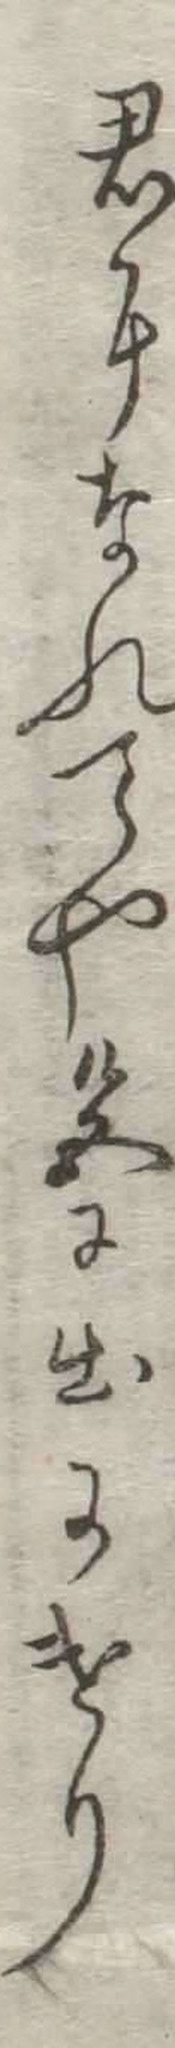君になれてや色に出にけり

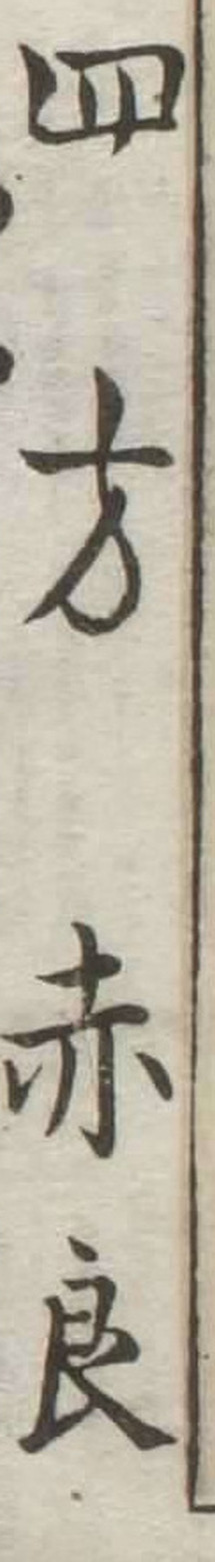四方赤良
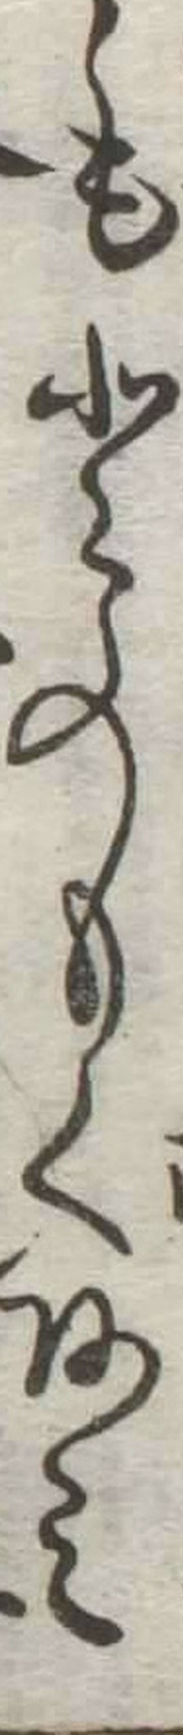もとのもくあみ
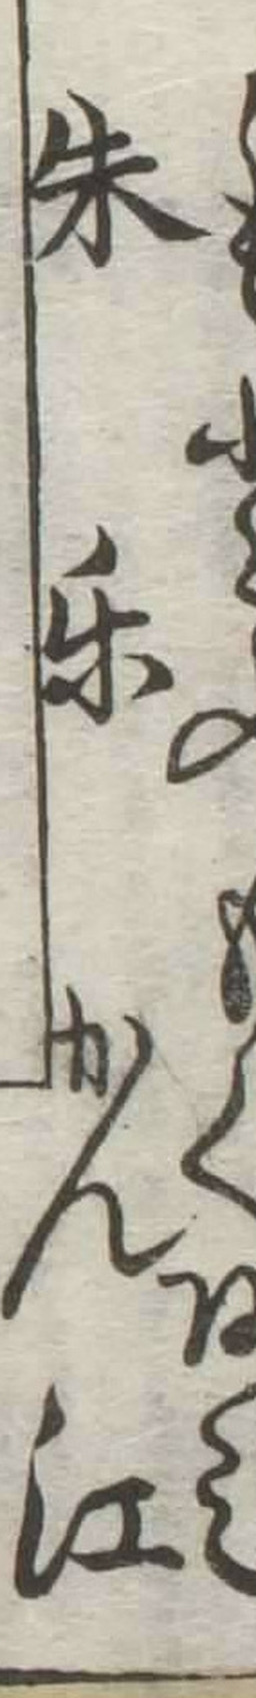朱楽かん江
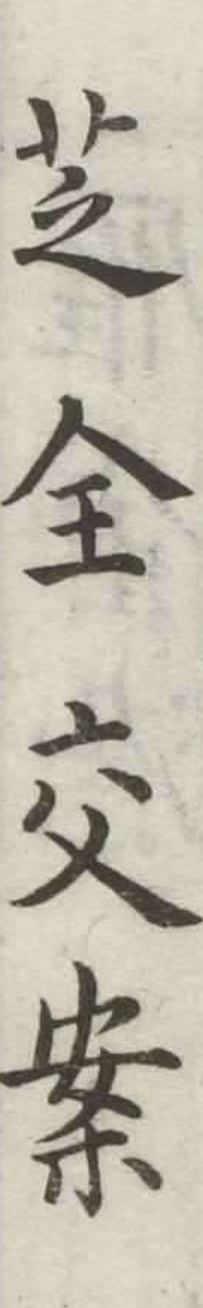芝全交案
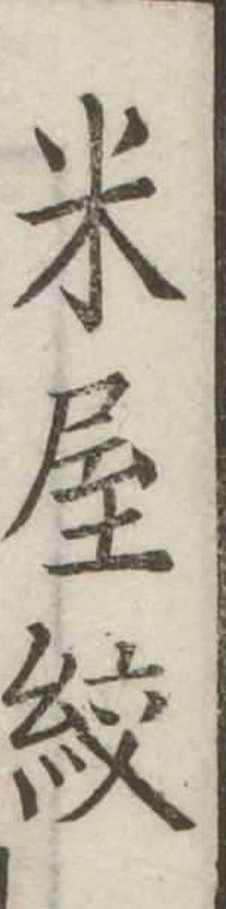米屋絞
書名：たなくひあわせ
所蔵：国文学研究資料館
